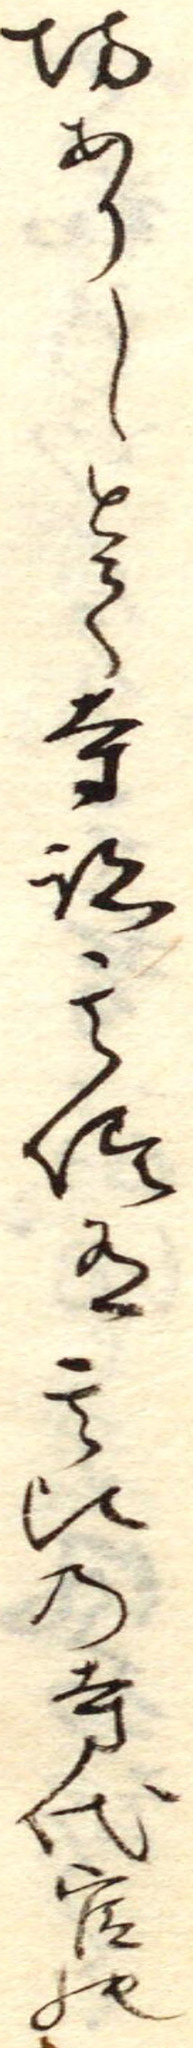坊ありしとて寺跡其侭有其比の寺代官の
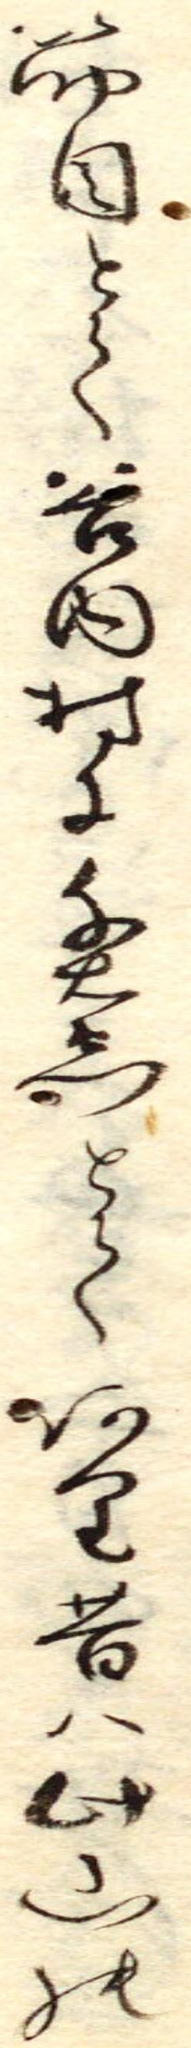筋目とて谷内村に千右衛門とてあり昔は此山の
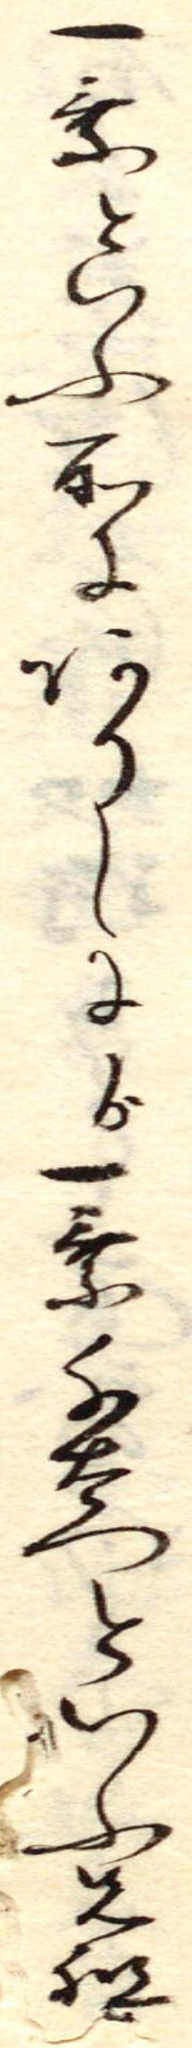一乗といふ所にありしにゟ一乗千右衛門といふ先祖
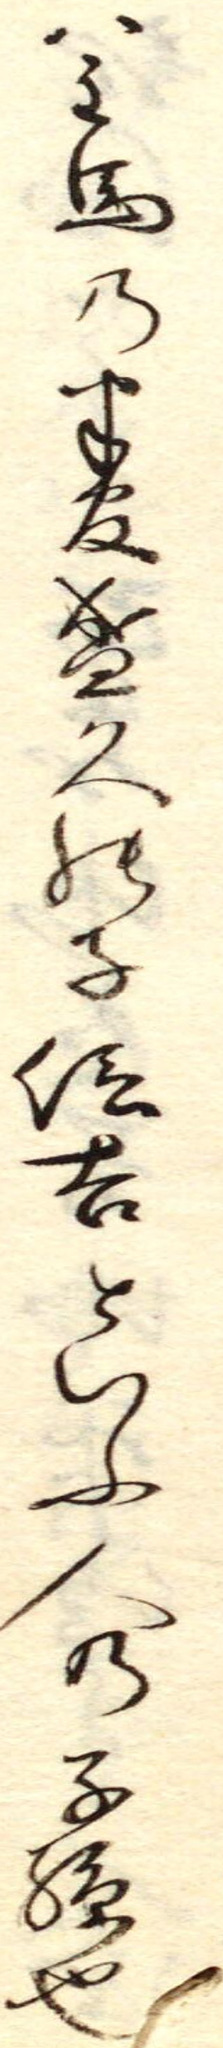は主馬の半官盛久の子信吉といふ人の子孫也
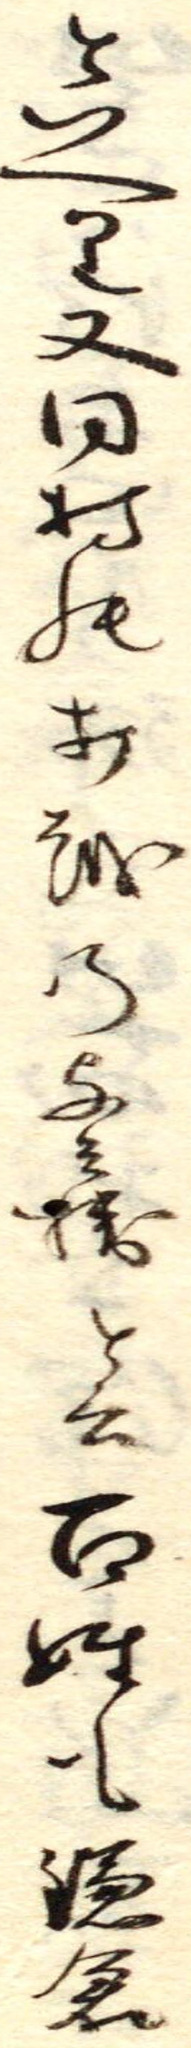といへり又同村の打越の与兵衛と言百姓も鎌倉
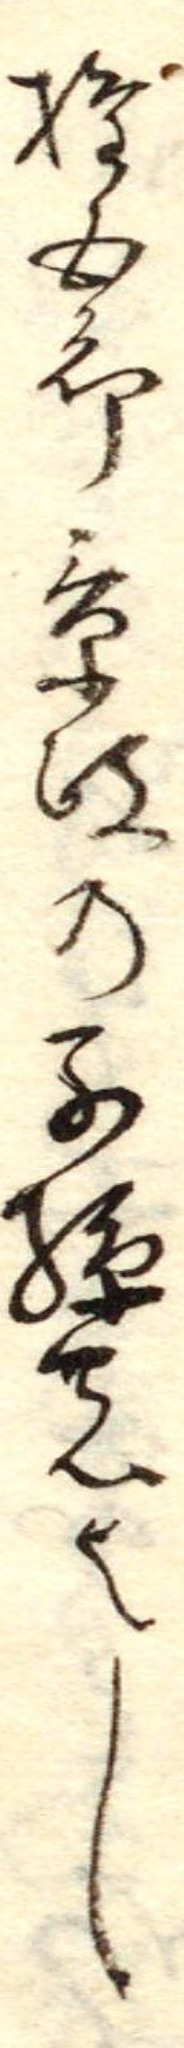権四郎景政の子孫のよし

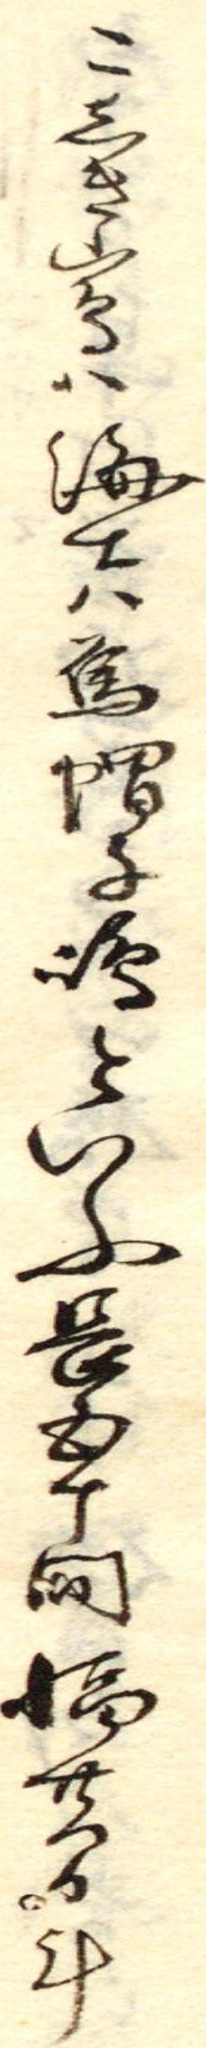こしき嶌は海士は烏帽子嶋といふ長五十間幅廿間斗
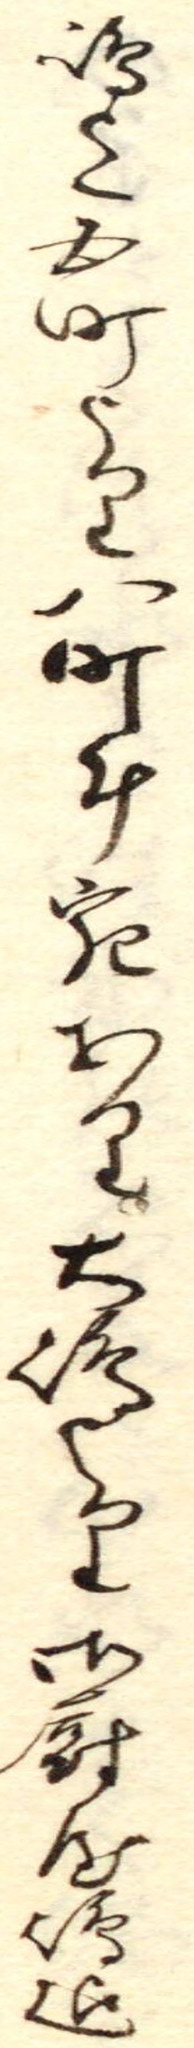嶋迄五町より八町斗宛あり大嶋より御厨屋嶋迄
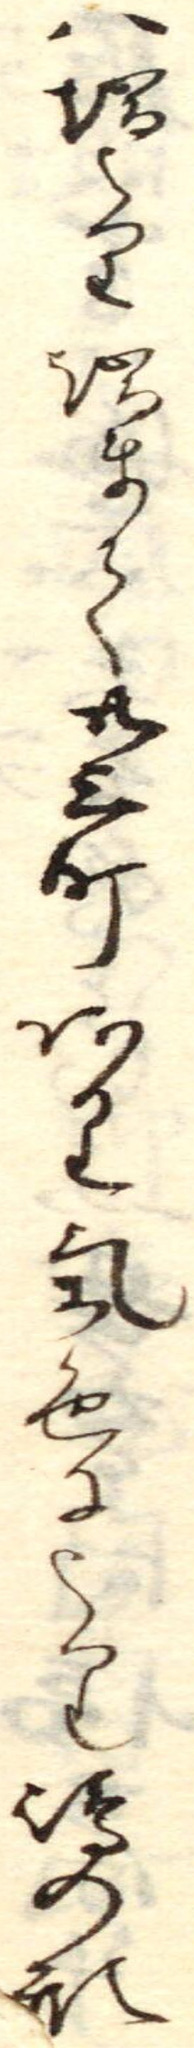は端より端まて廿三町あり気色により嶋の形
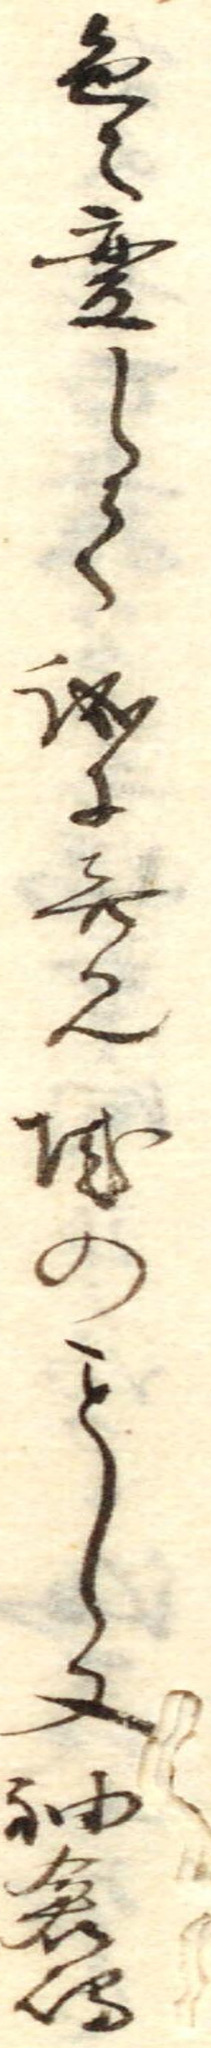色々変して誠に喜見城のことし又舳倉嶋
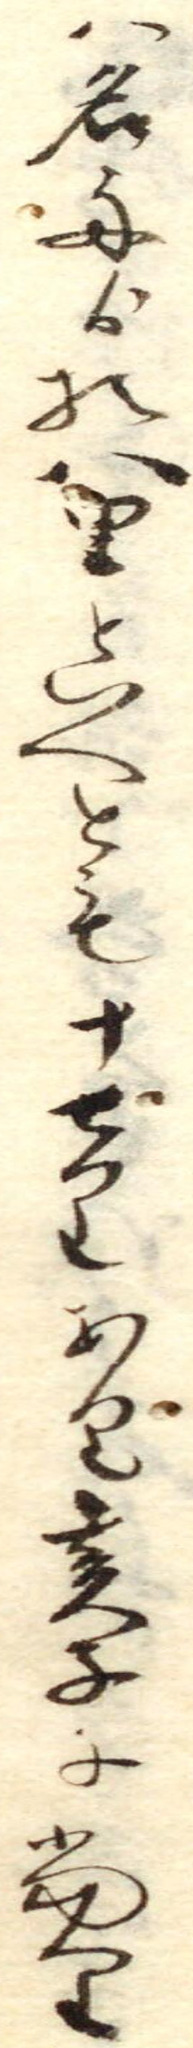は名舟ゟ拾八里といへとも十七里あり亥子に当り
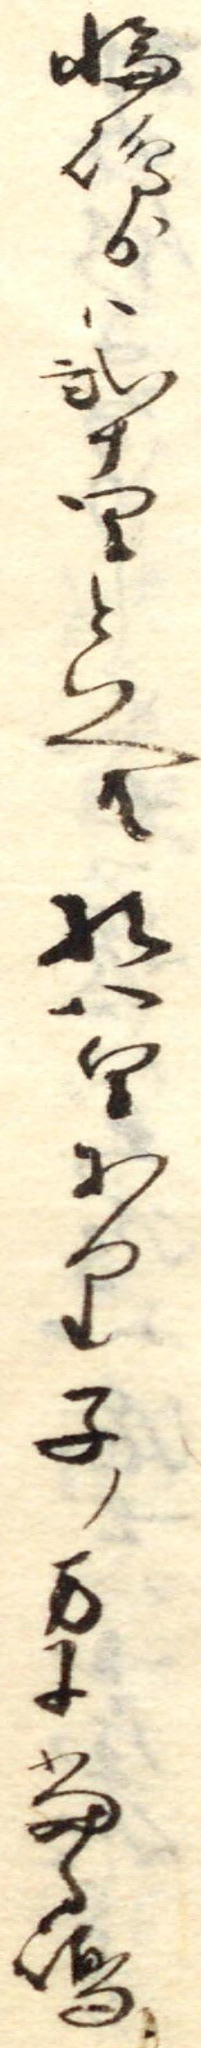輪嶋ゟは弐十里といへ共拾八里あり子ノ方に当る嶋
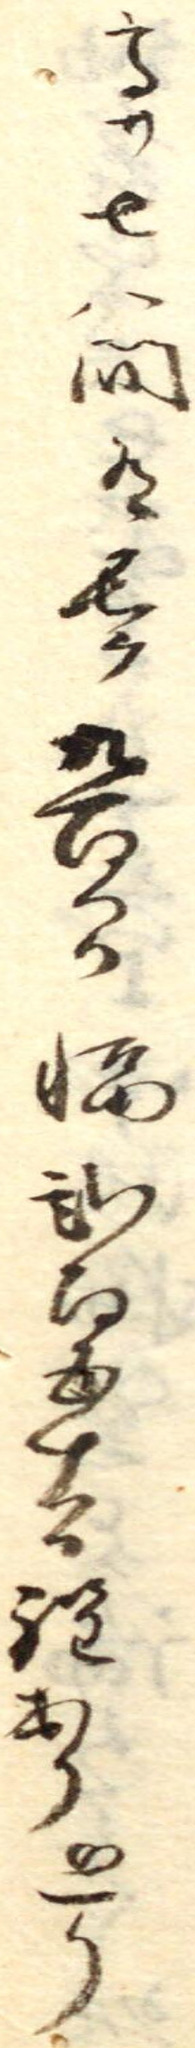高さ七八間有長さ九百間幅弐百五十間程あり廻り
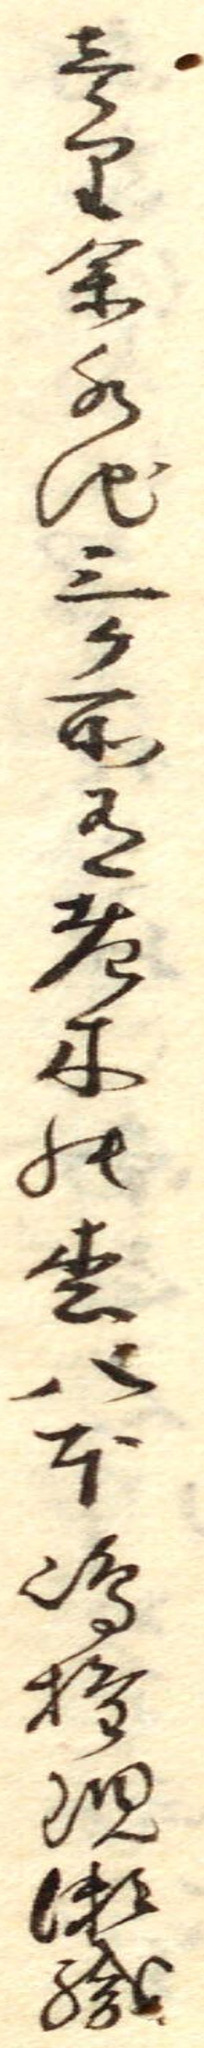壱里余水池三ヶ所有老木の枩八本嶋権現瀬織
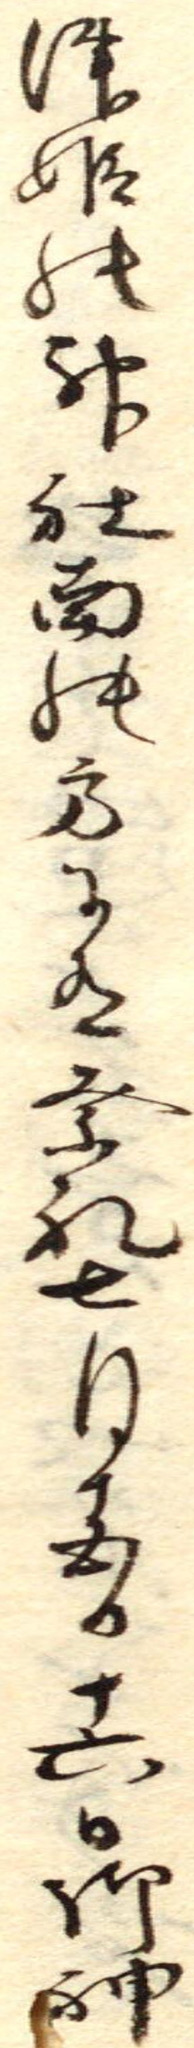津姫の神社南の方に有り祭礼七月十五日十六日御神
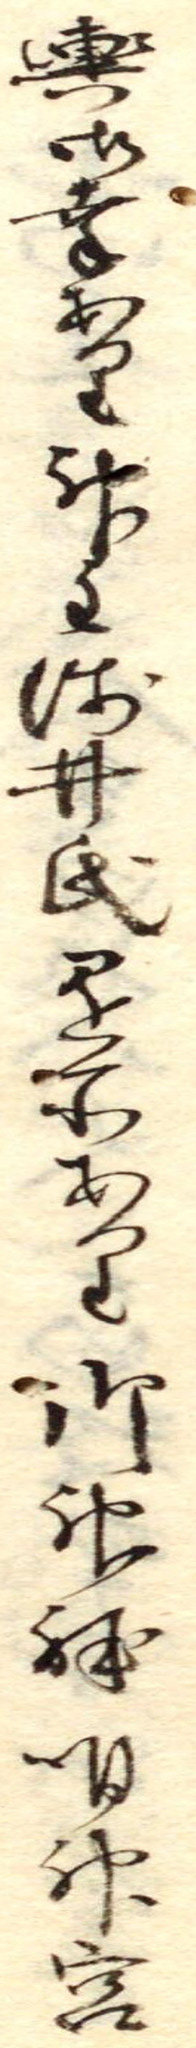輿御幸あり神主浅井氏懸所あり御神体明神宮
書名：能登名跡誌
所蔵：Ishikawa Prefectural Library
